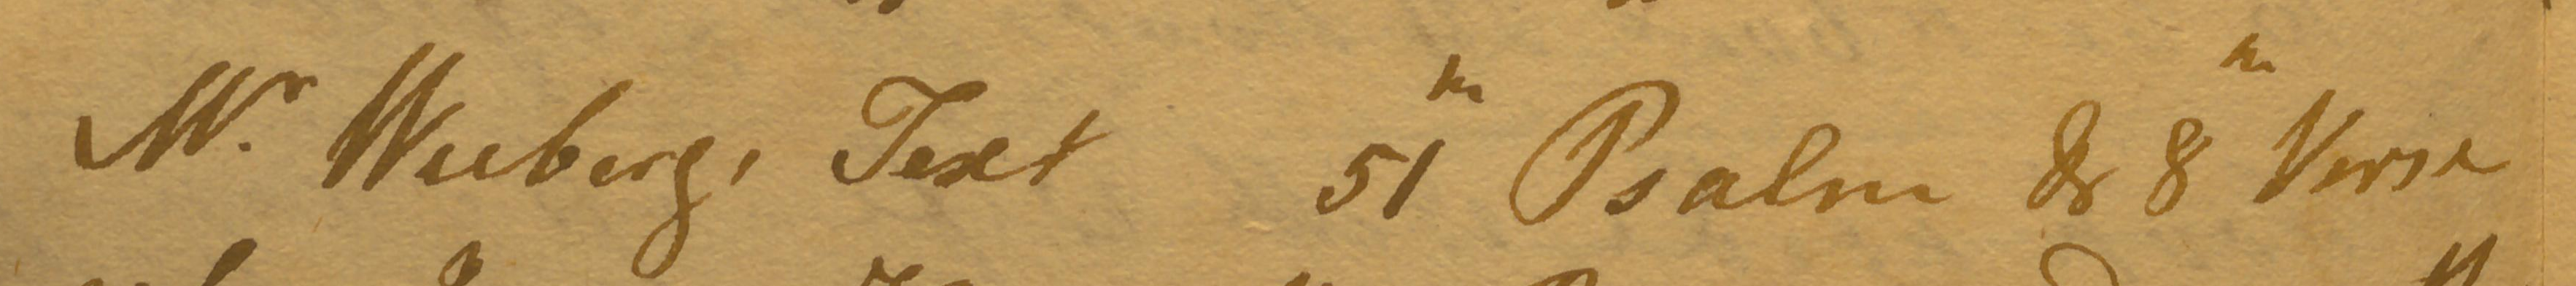M^r. Weibergs Text 51^th Psalm & 8^th Verse
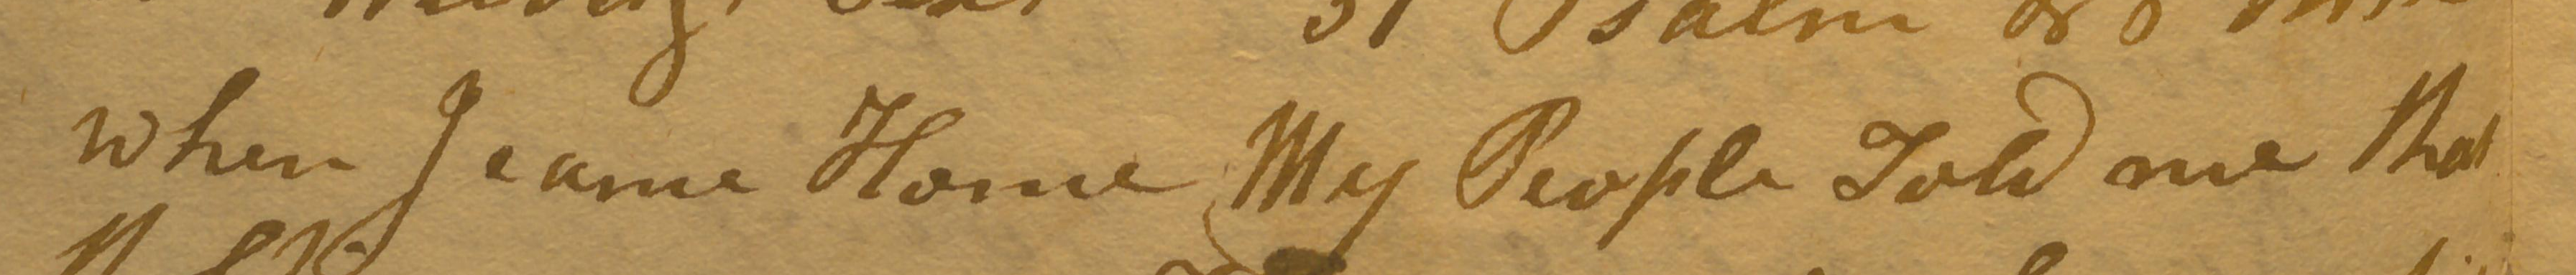when I came Home, My People Told me that
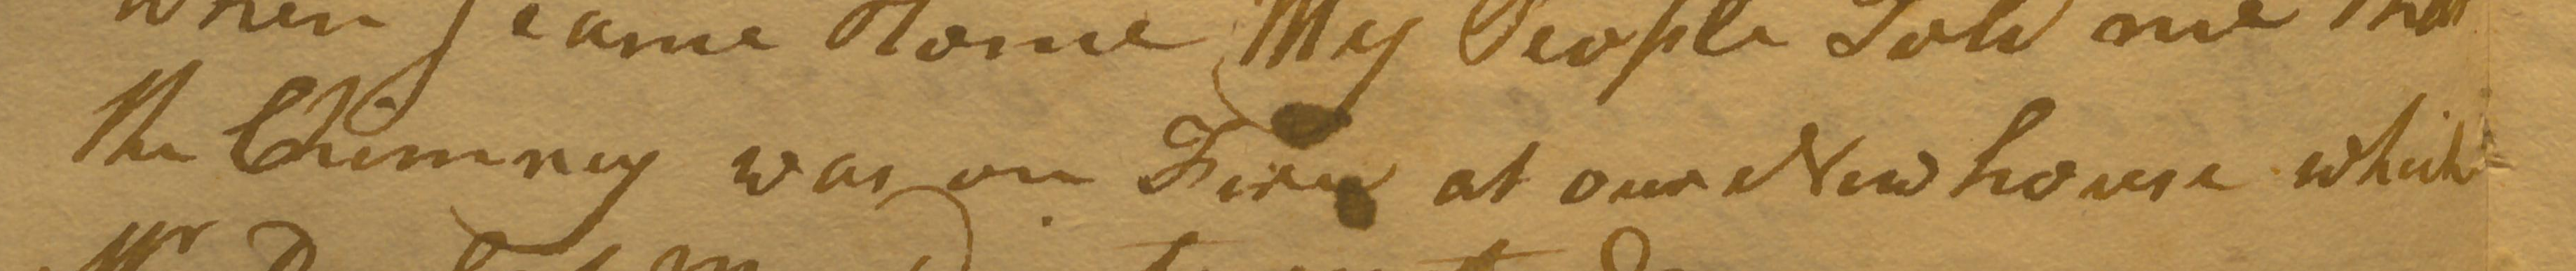the Chimney was on Fire at our New house which
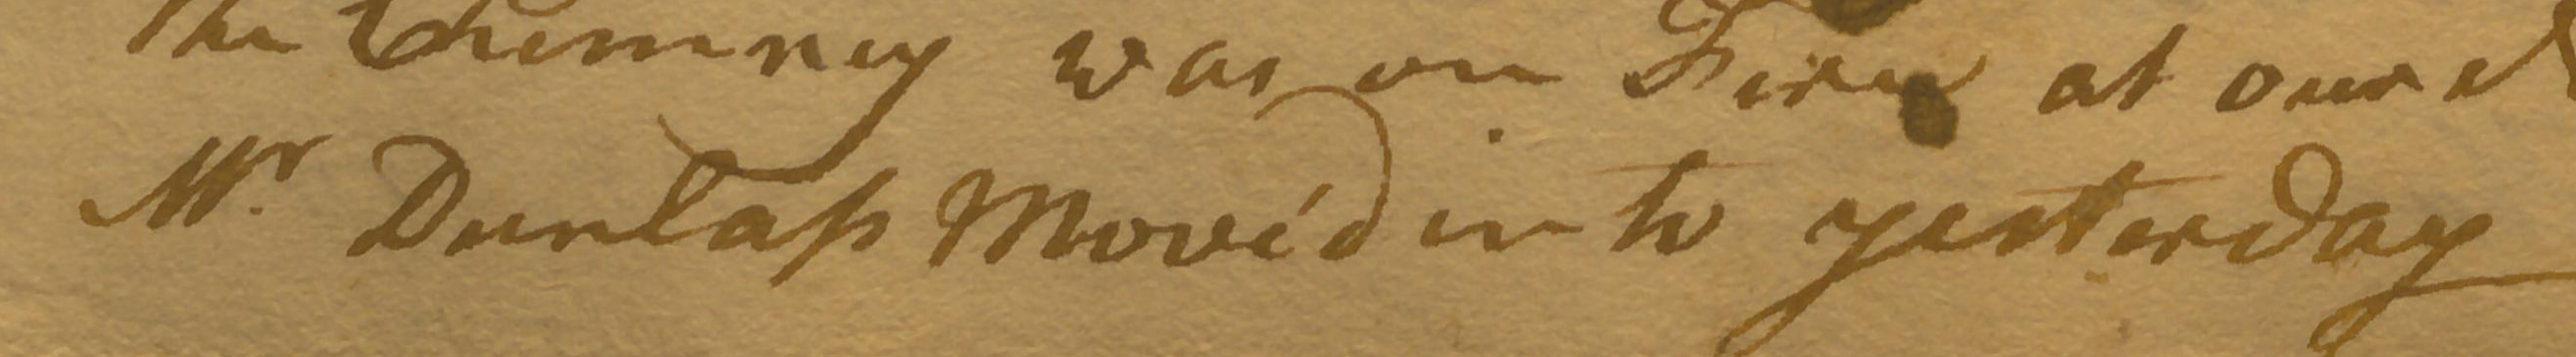M^r. Dunlap Move'd in to yesterday
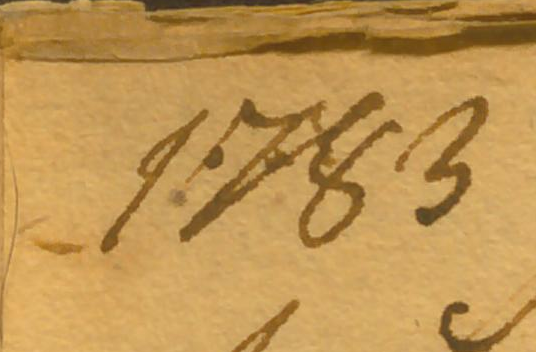1783
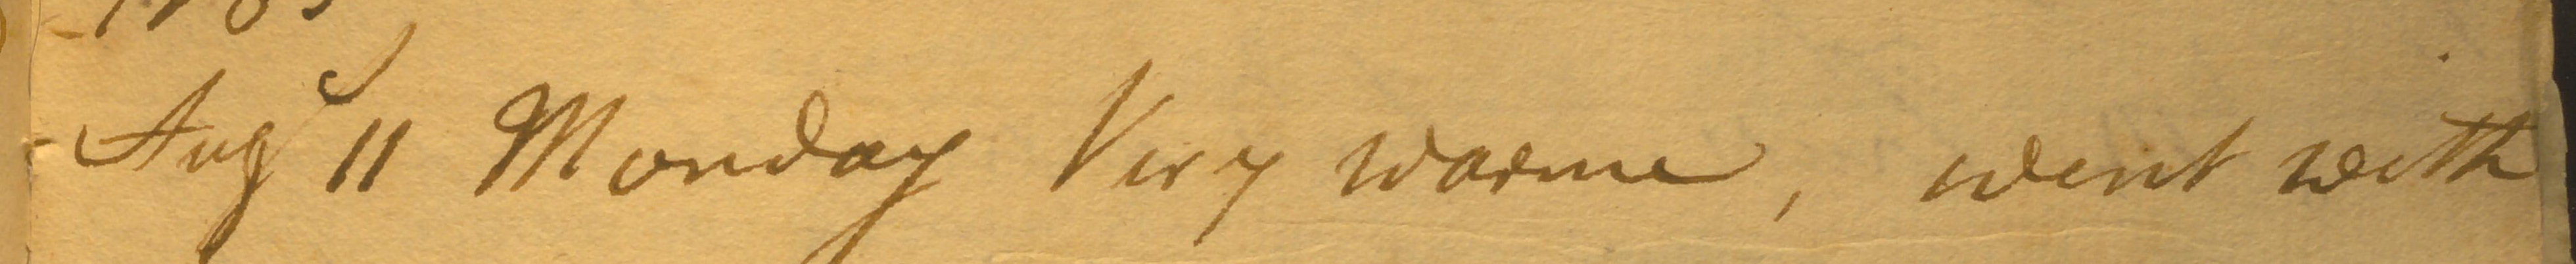Aug 11 Monday Very warme, went with
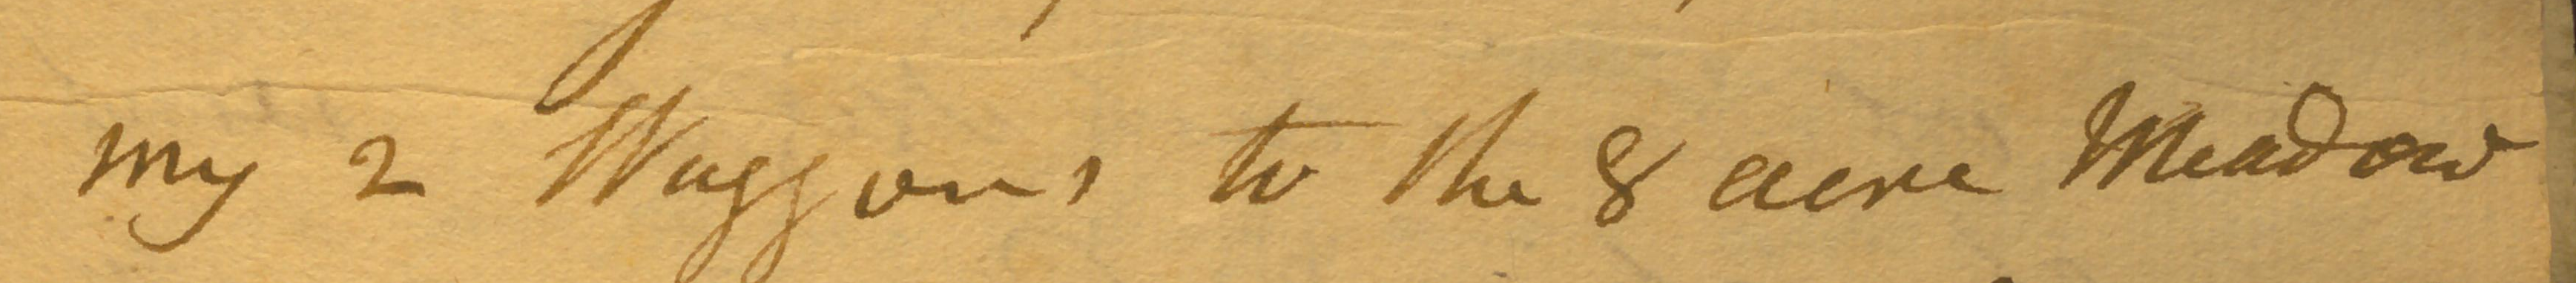my 2 Waggons to the 8 acre Meadow
